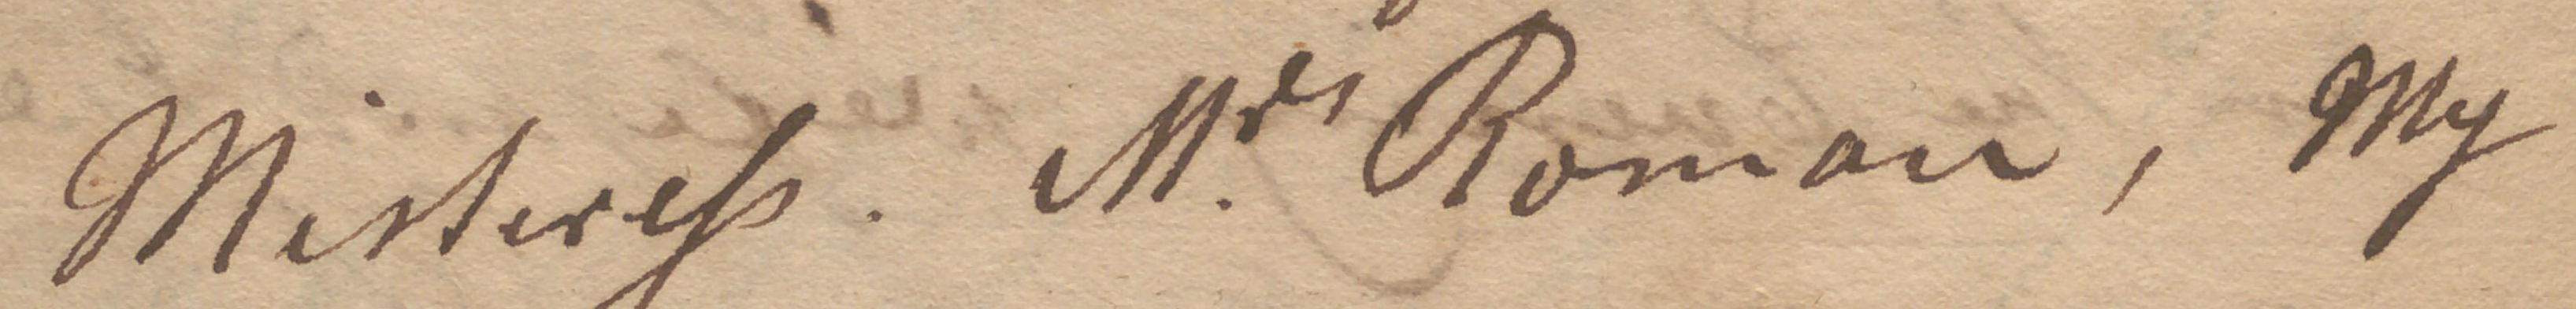Misteress. M^r. Roman, My
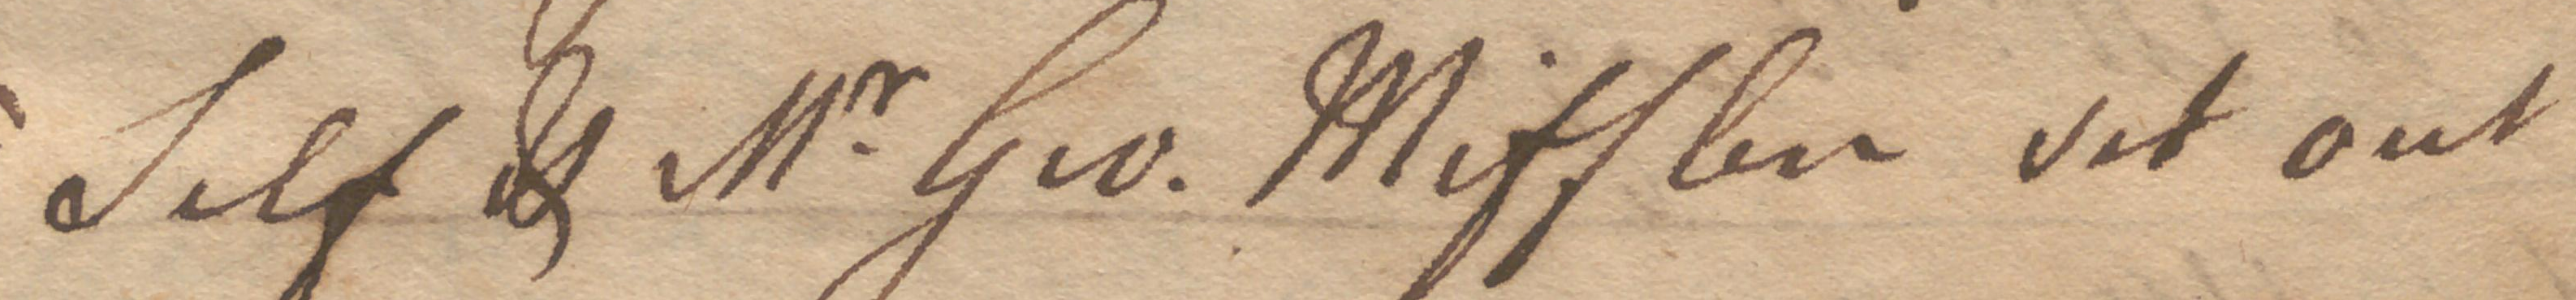self & M^r Geo. Mifflin sit out
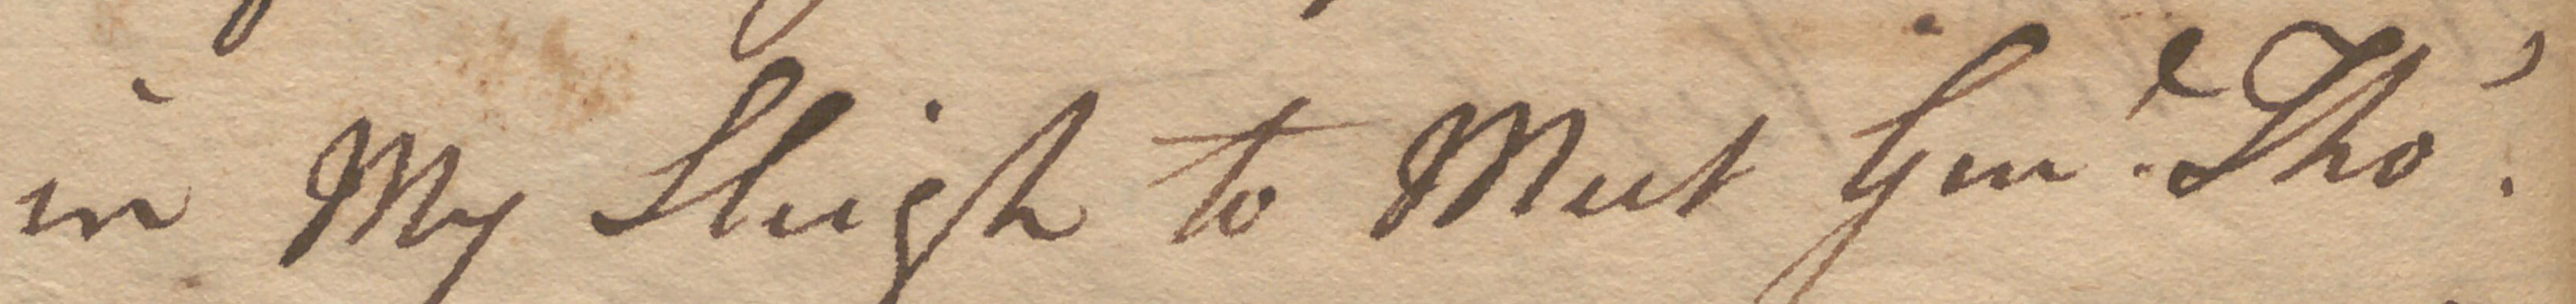in My Sleigh to Meet Gen^l. Tho^s.
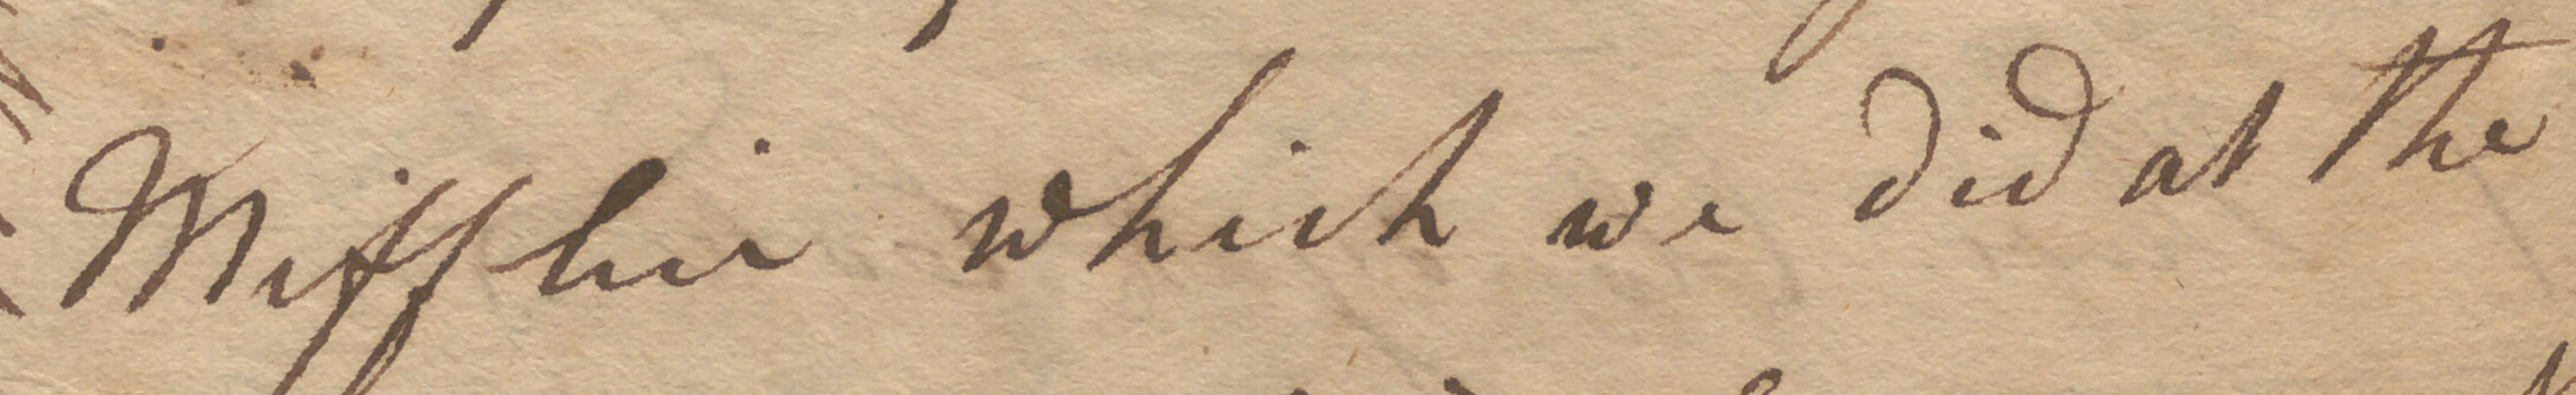Mifflin which we did at the
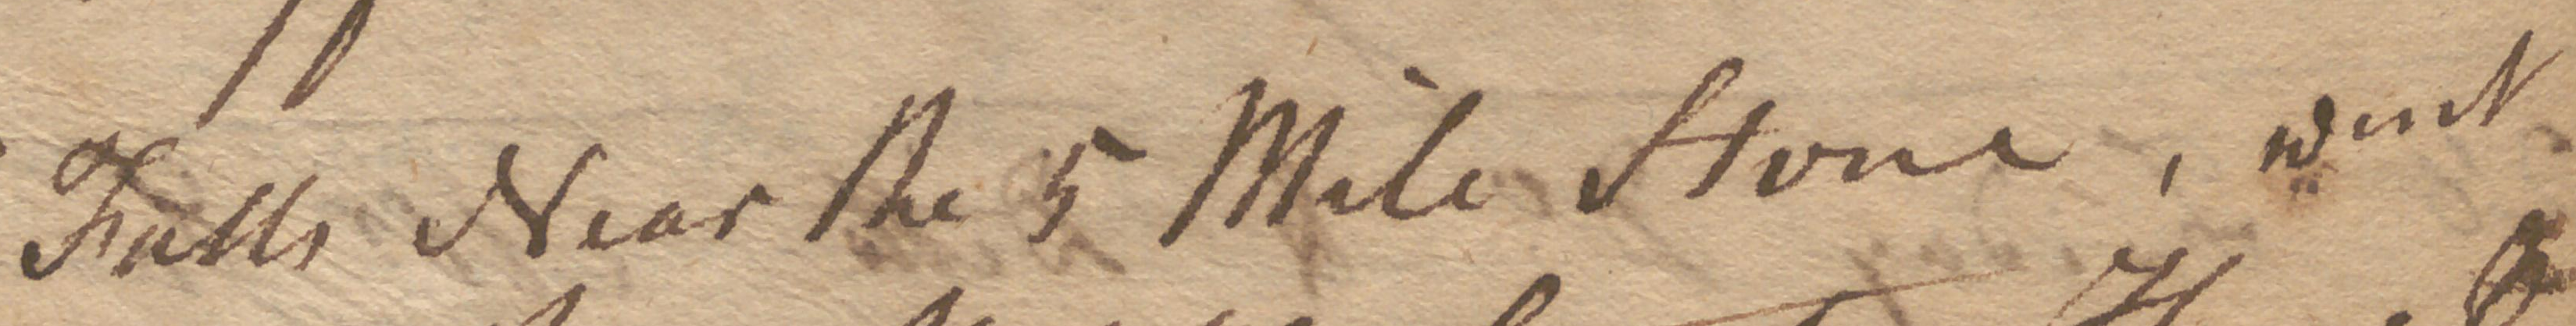Falls Near the 5 Mile Stone, went
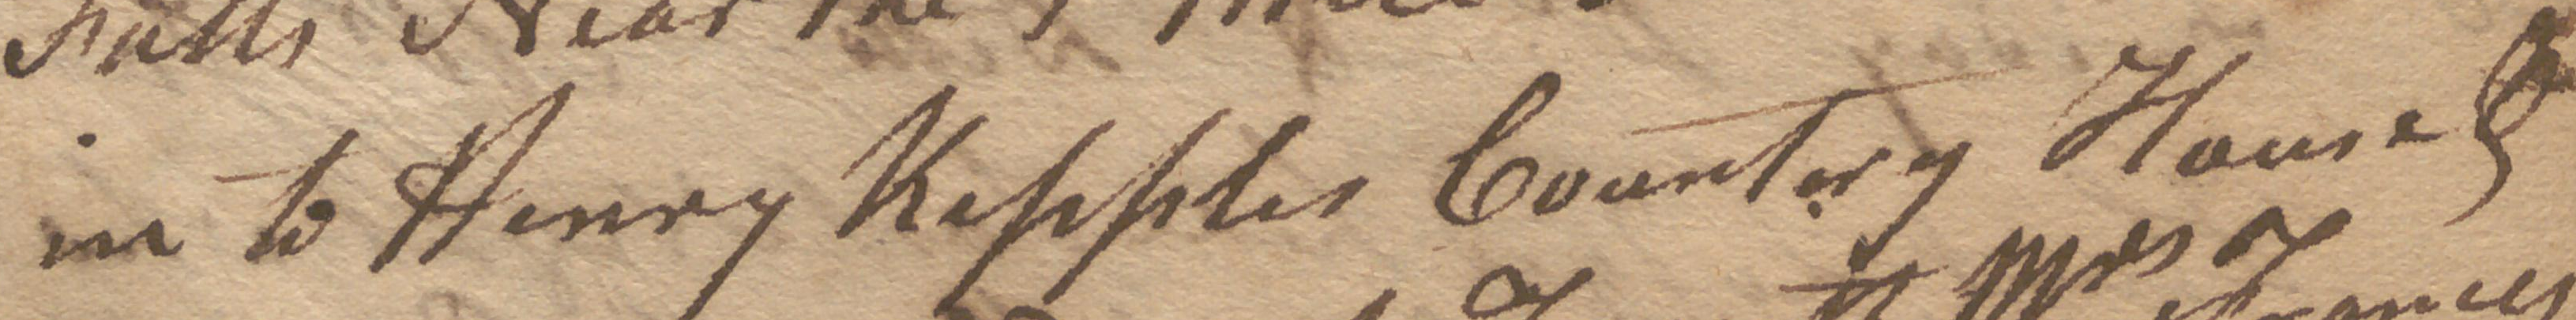in to Henry Kepples Country House &
